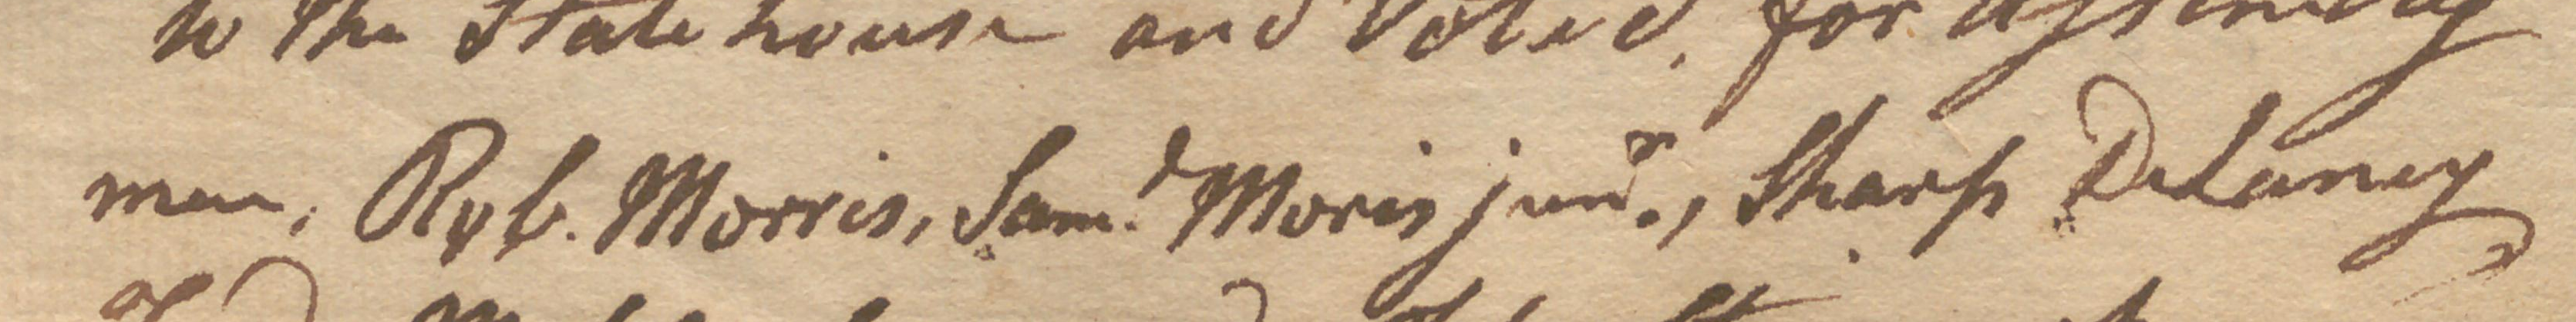men, Rob. Morres, Sam^l. Moris jun^r., Sharp DeLaney
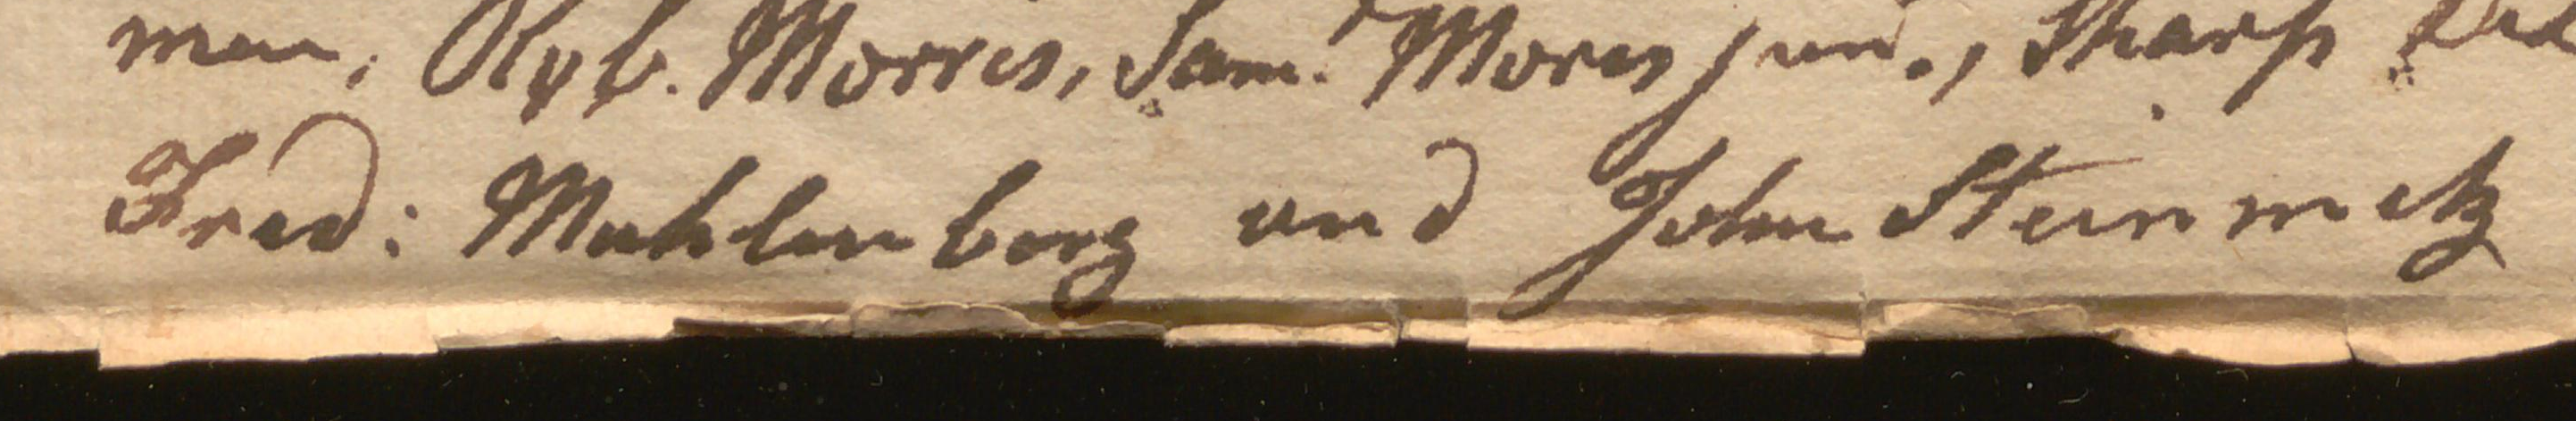Fred. Muhlenberg and John Steinmetz
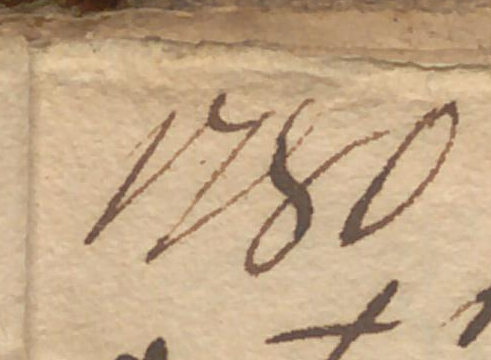1780
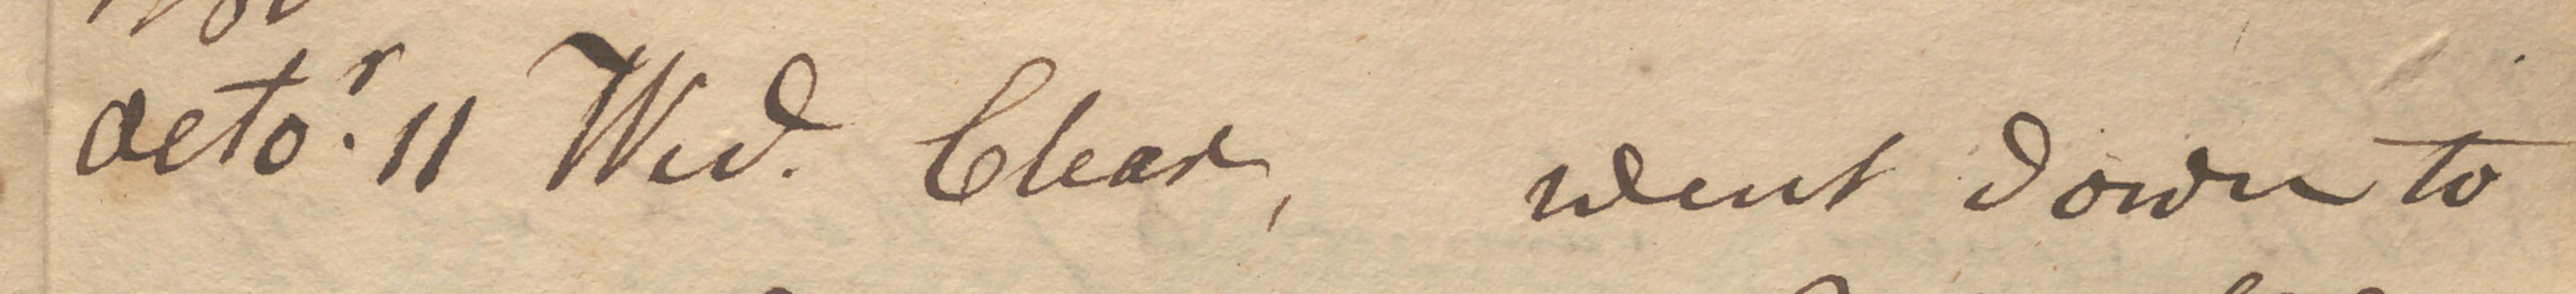Octo^r. 11 Wed. Clear went down to
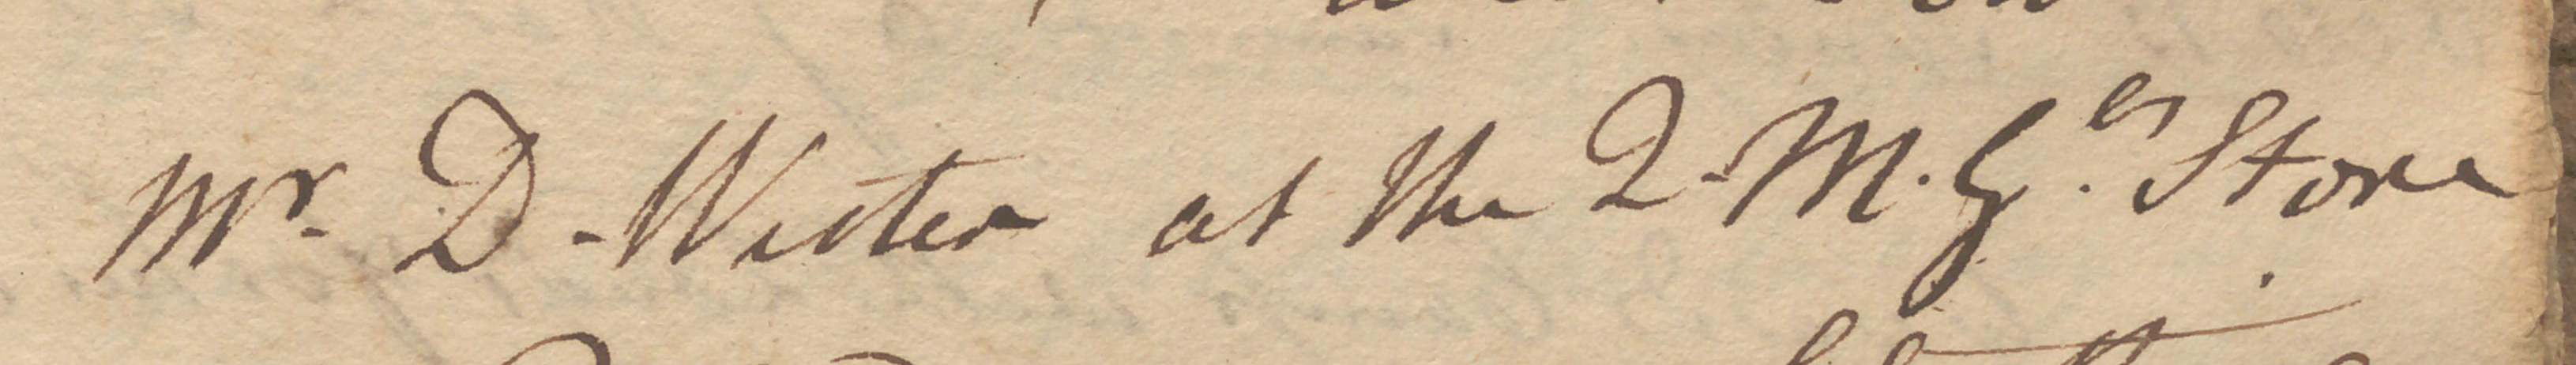M^r. D. Wester at the Q.M.G^ls. Store
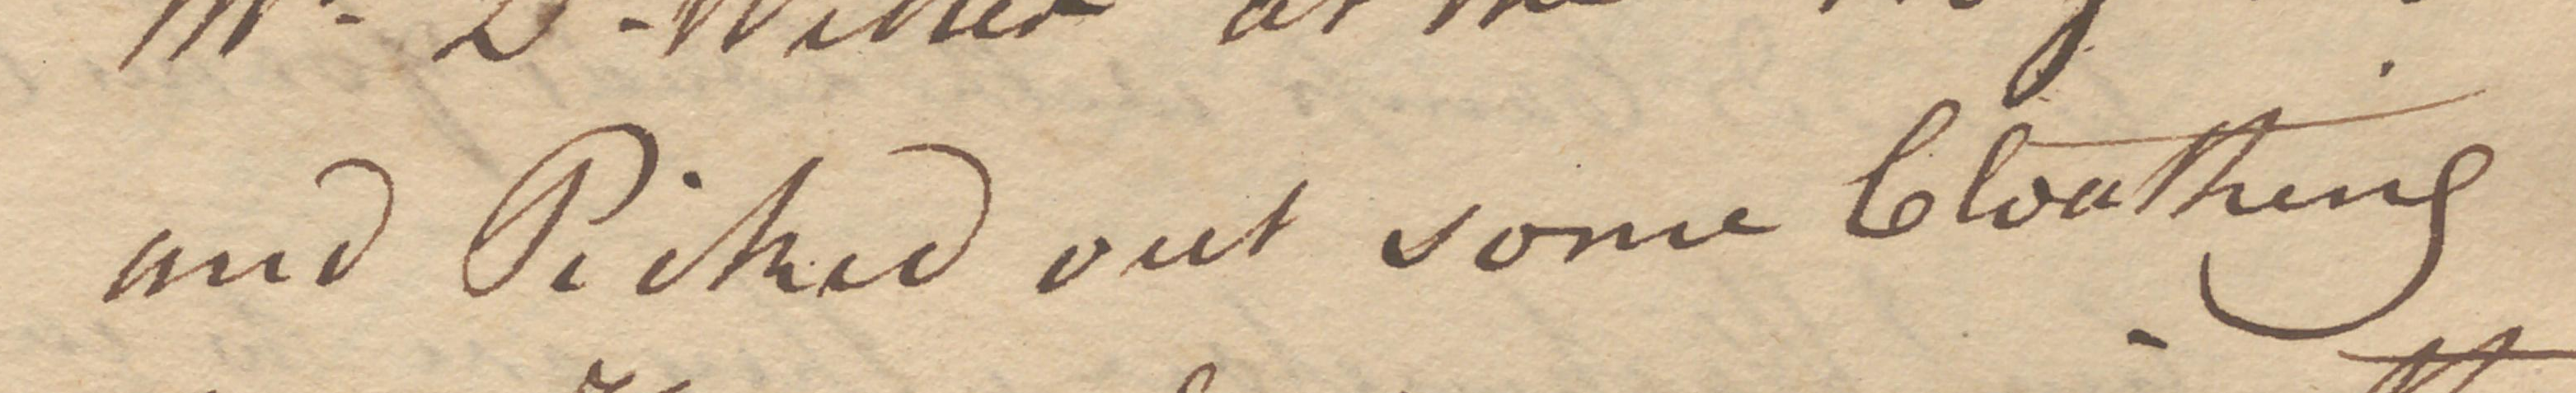and Picked out some Cloathing
